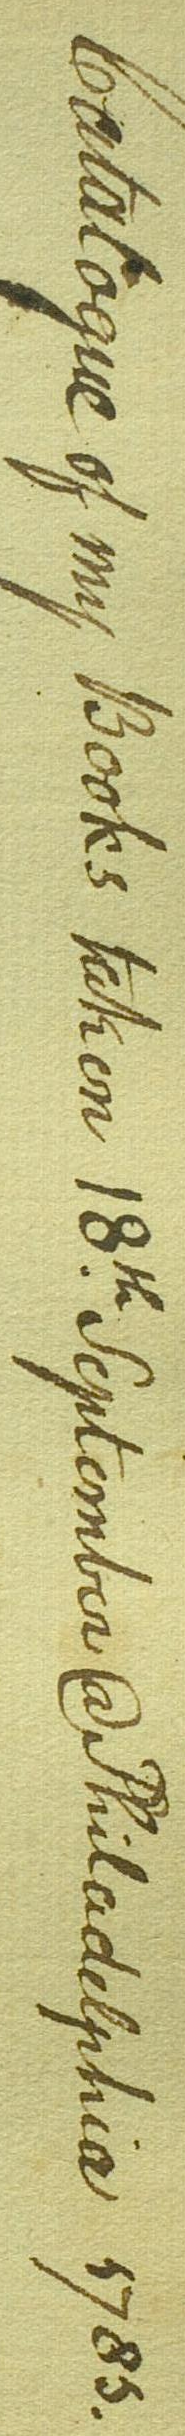Catalogue of my Books taken 18^th. September @ Philadelphia 1785.
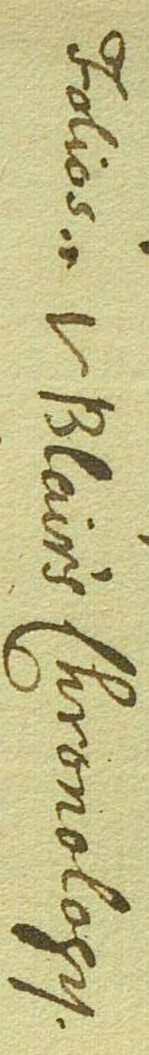Folios. - Blair's Chronology.
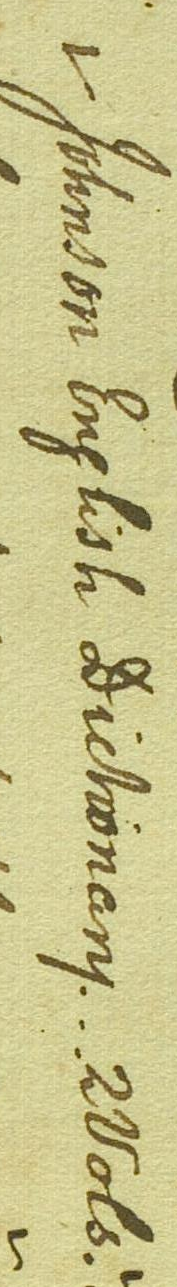- Johnson English Dictionary... 2 Vols.
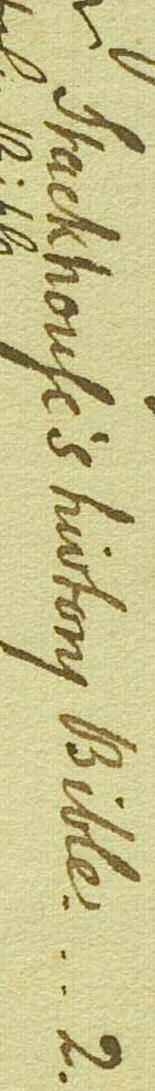- Stackhouse's history Bible... 2.
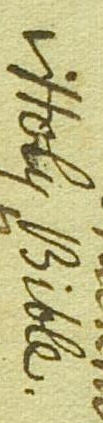- Holy Bible.
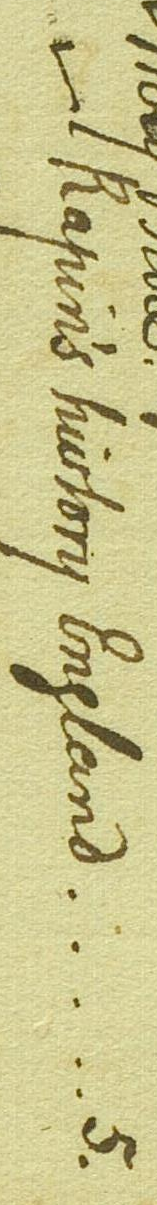- Rapin's history England.....5. V ~ Puffendorf's introduction
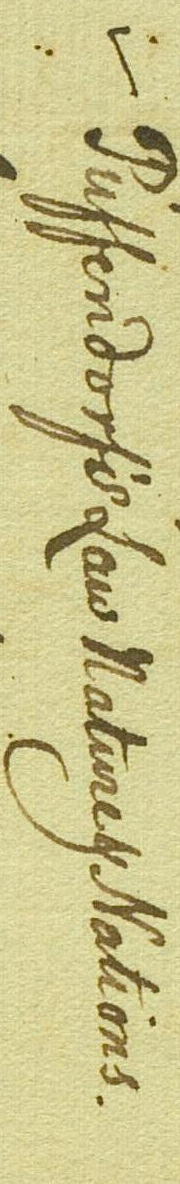- Puffendorf's Law Nature & Nations.
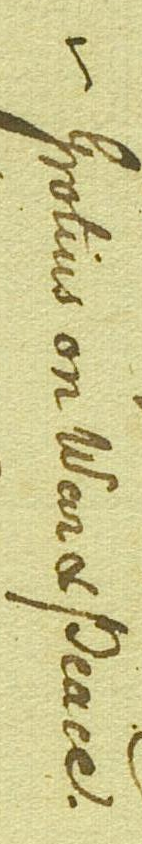- Grotius on War & Peace.
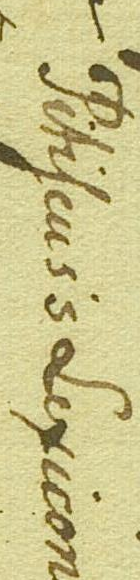- Pitiscus's Lexicon
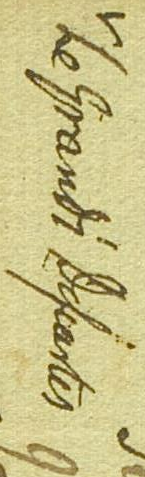- Le Grand's Descartes
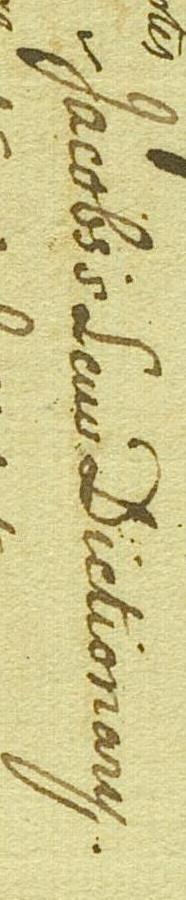- Jacobs's Law Dictionary.
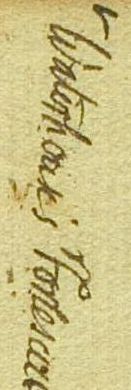- Waterhouse's Fortescue
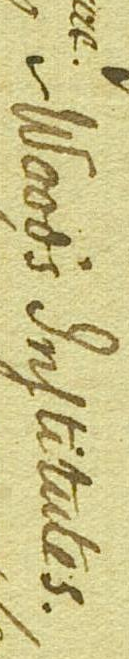- Wood's Institutes.
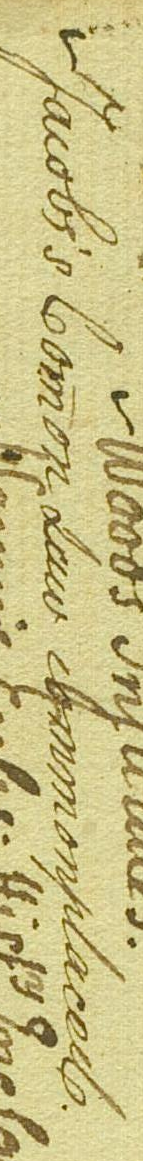- Jacobs's Com̄on Law commonplaced.
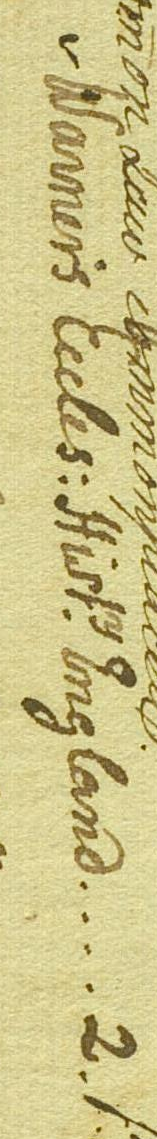- Warner's Eccles: Hist^y. England.... 2.1^d
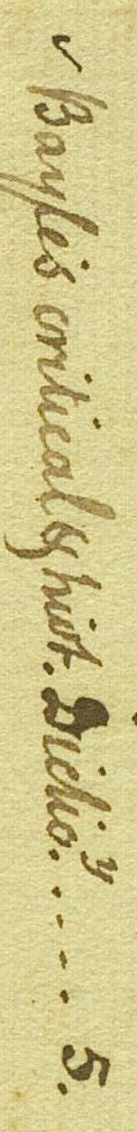- Bayle's critical & hist. Dictio^y .... 5.
